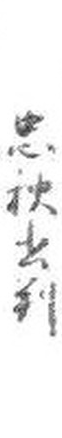忠清書判
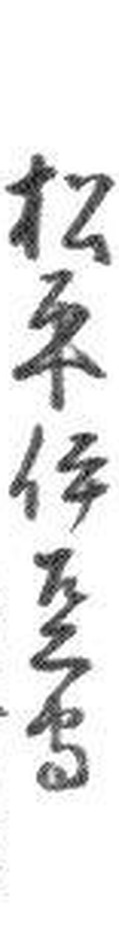松平伊豆守
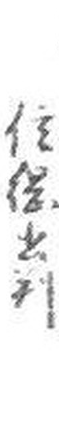信綱書判
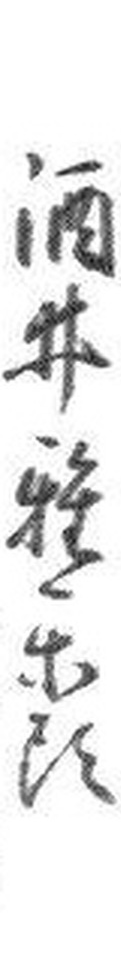酒井雅楽頭
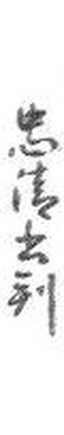忠清書判
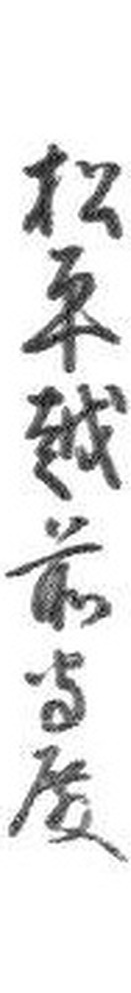松平越前守殿
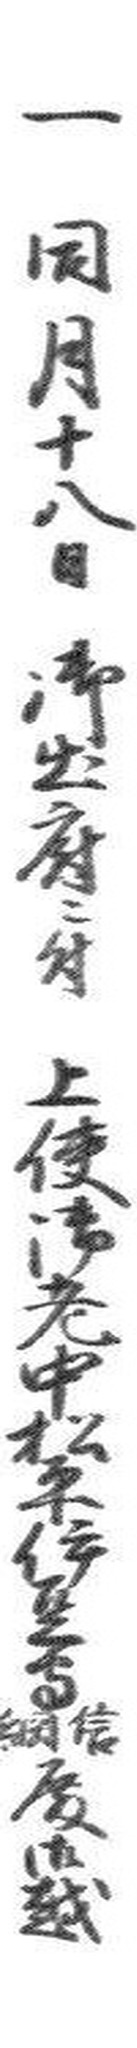一同月十八日御出府ニ付上使御老中松平伊豆守信綱殿御越
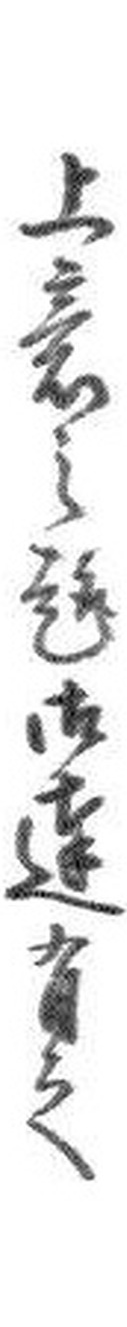上意之趣御達有之

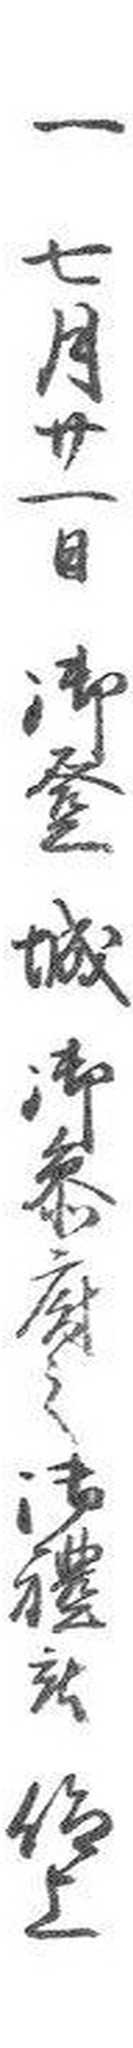一七月廿一日御登城御参府之御礼被仰上
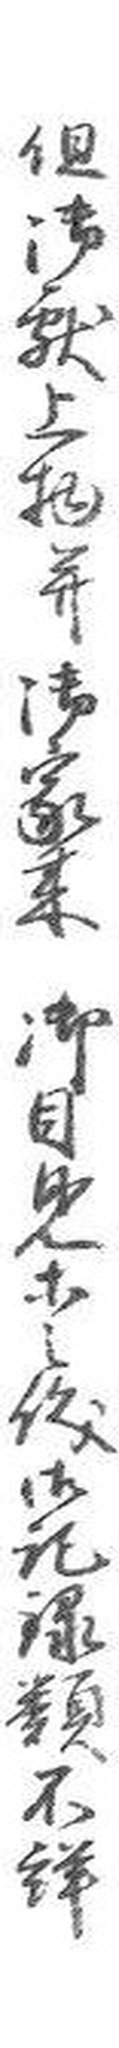但御献上物并御家来御目見等之儀御記録類不詳
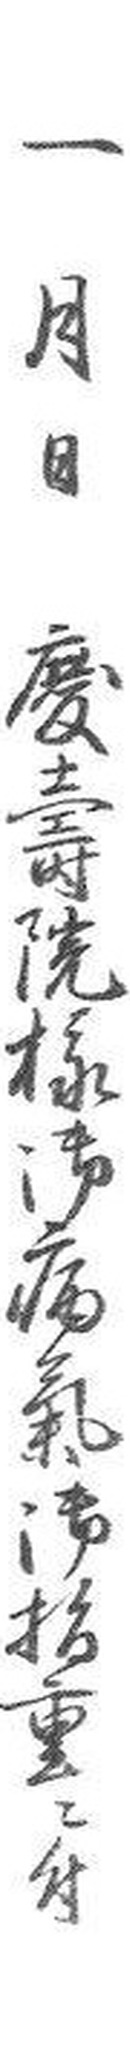一月日慶寿院様御病気御指重ニ付
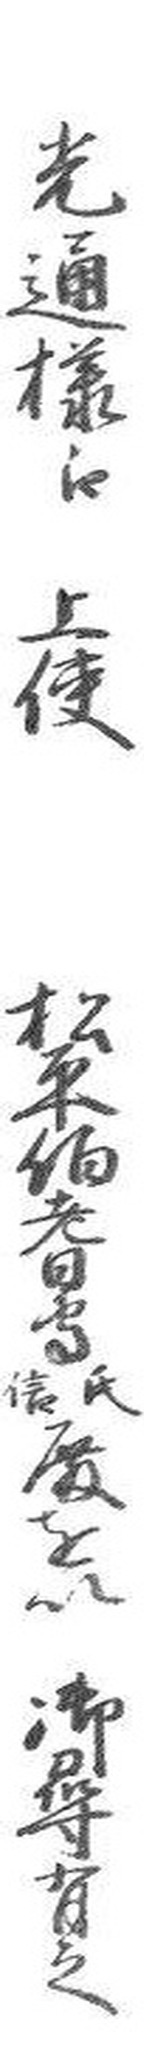光通様江上使松平伯耆守氏信殿を以御尋有之
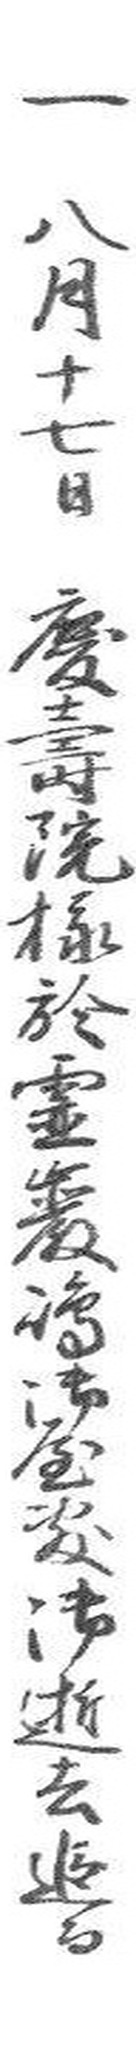一八月十七日慶寿院様於霊巌島御屋敷御逝去追而
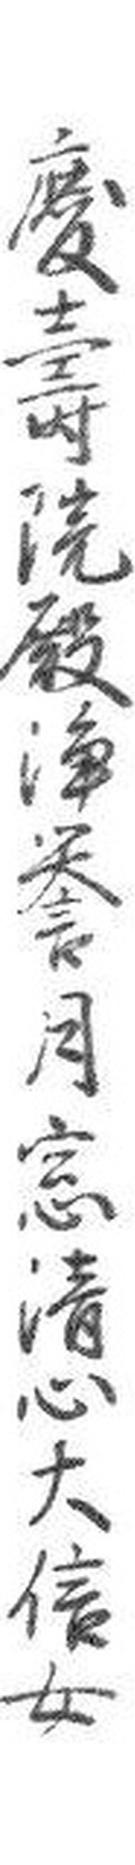慶寿院殿浄誉月窓清心大信女
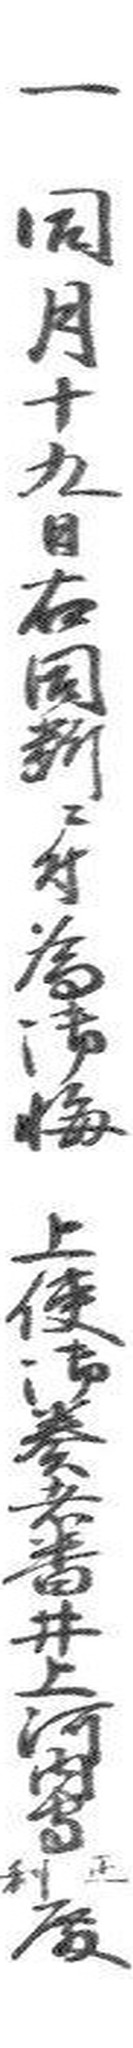一同月十九日右同断ニ付為御悔上使御奏者番井上河内守正利殿
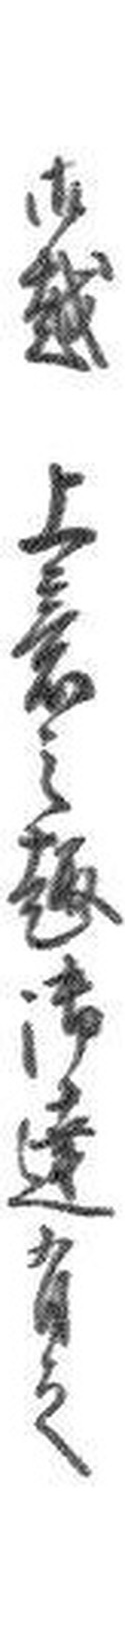御越上意之趣御達有之
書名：家譜 五 光通公 従寛永十三年到万治二年
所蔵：福井県文書館 Fukui Prefectural Archives
